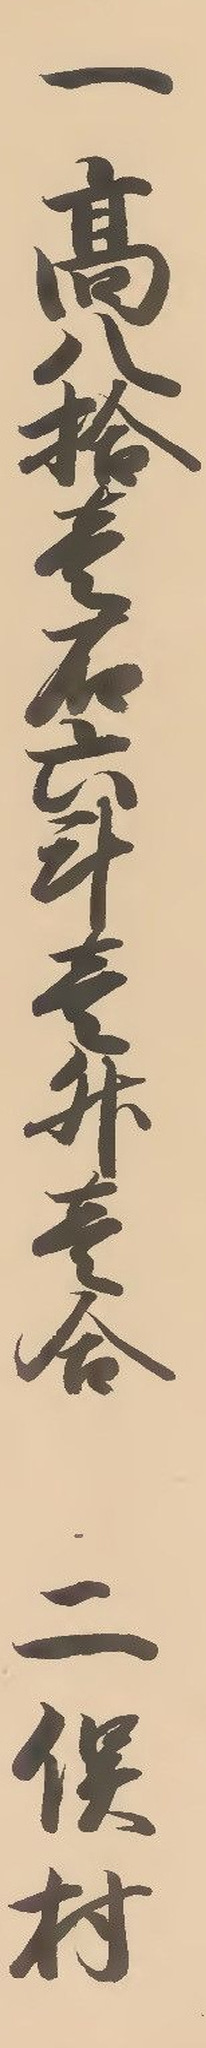一高八拾壱石六斗壱升壱合二俣村
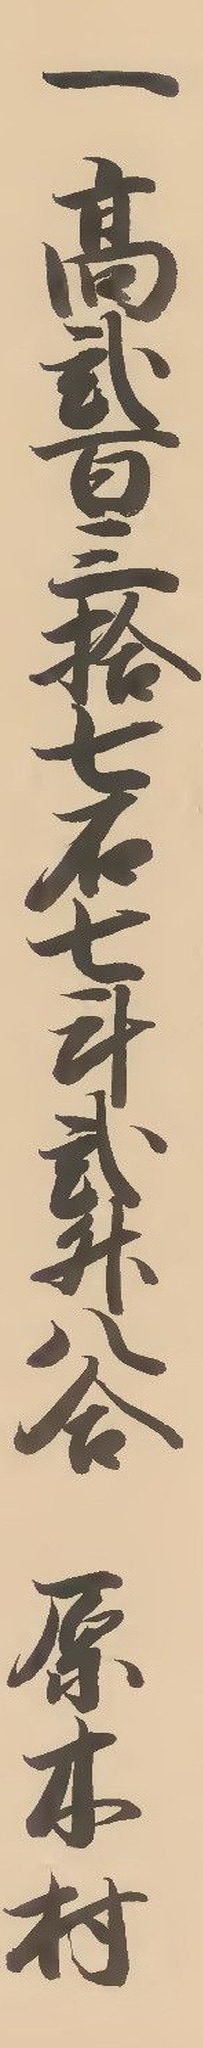一高弐百三拾七石七斗弐升八合原木村
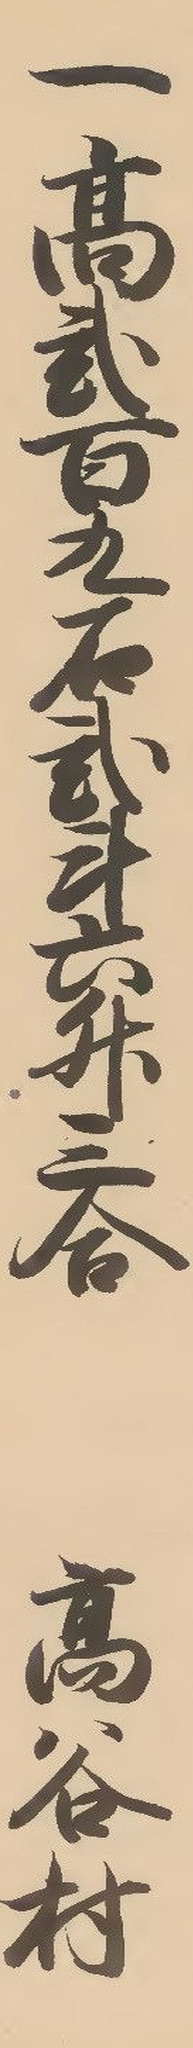一高弐百九石弐斗六升三合高谷村

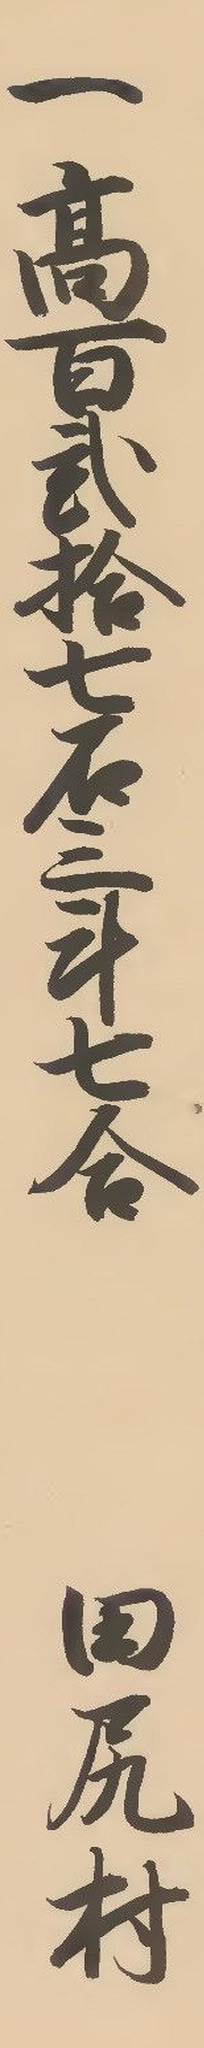一高百弐拾七石三斗七合田尻村
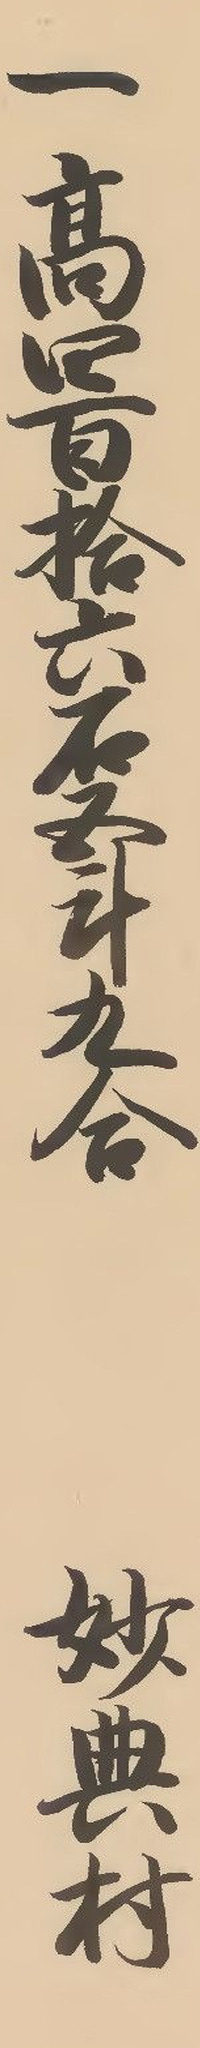一高四百拾六石五斗九合妙典村
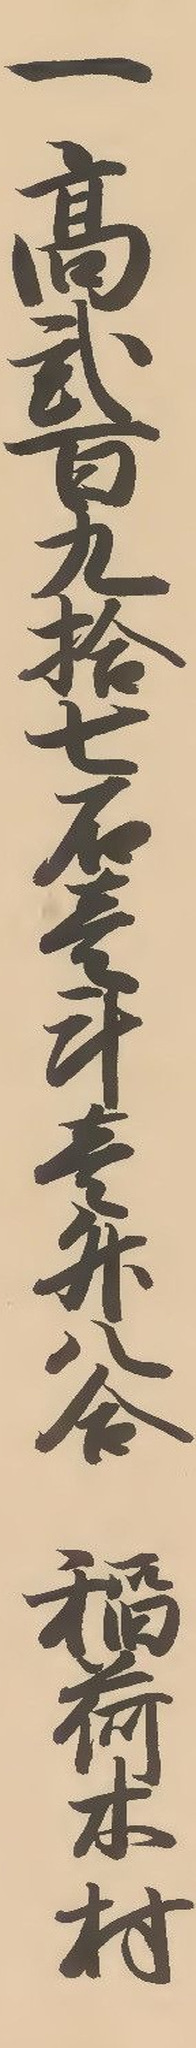一高弐百九拾七石壱斗壱升八合稲荷木村
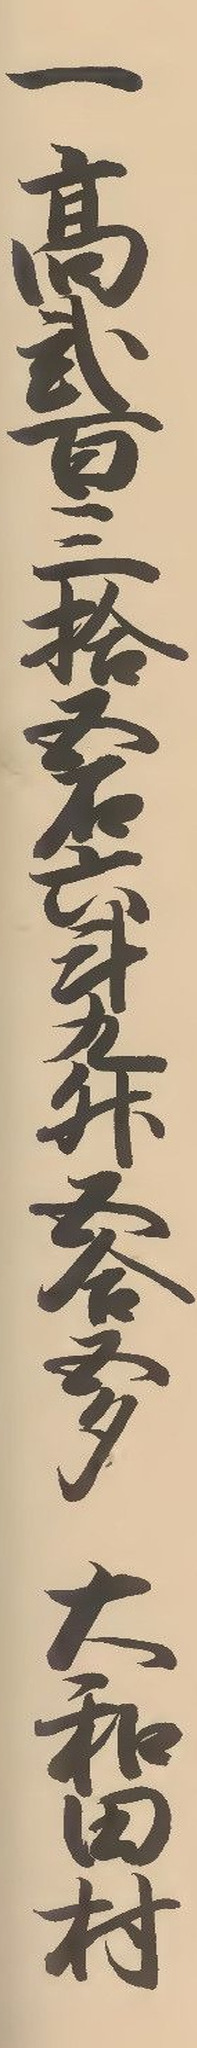一高弐百三拾五石六斗九升五合五勺大和田村
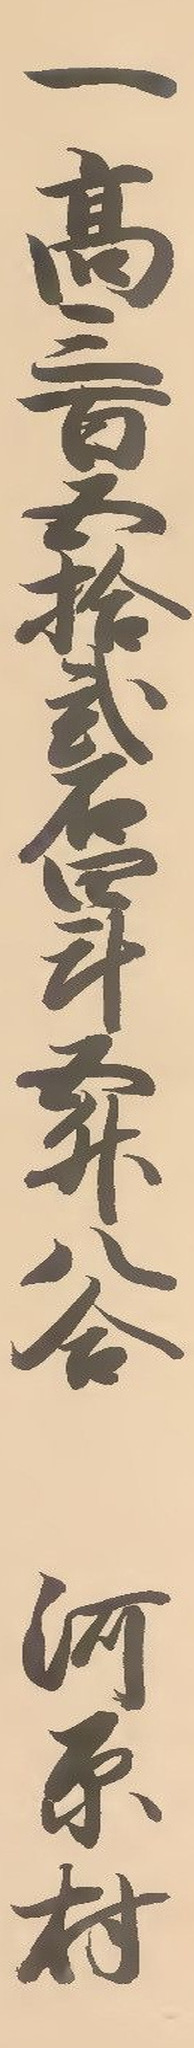一高三百五拾弐石四斗五升八合河原村
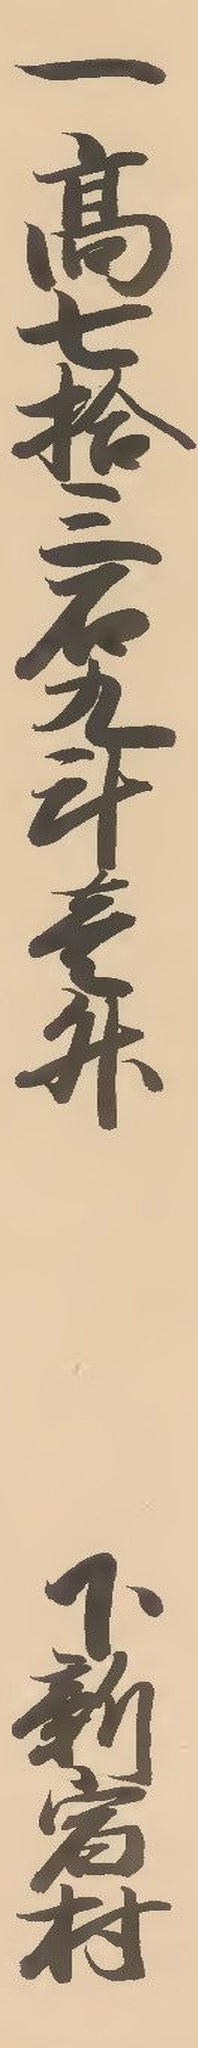一高七拾三石九斗壱升下新宿村
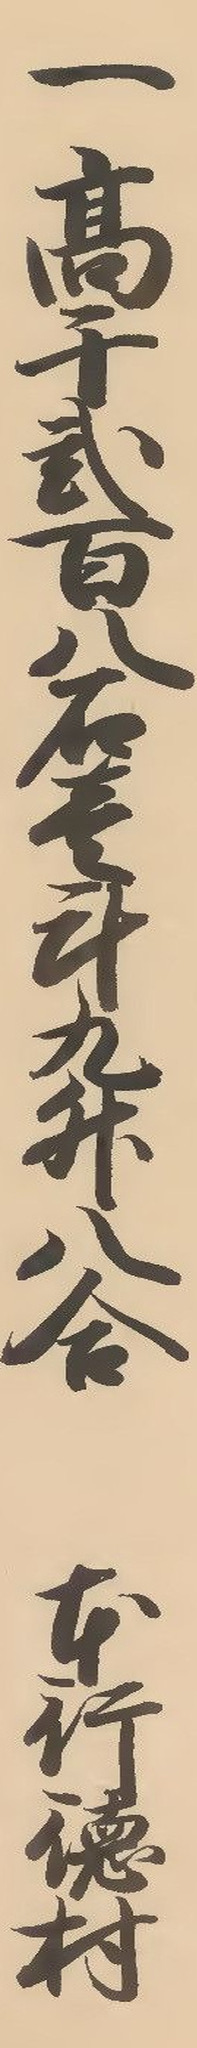一高千弐百八石壱斗九升八合本行徳村
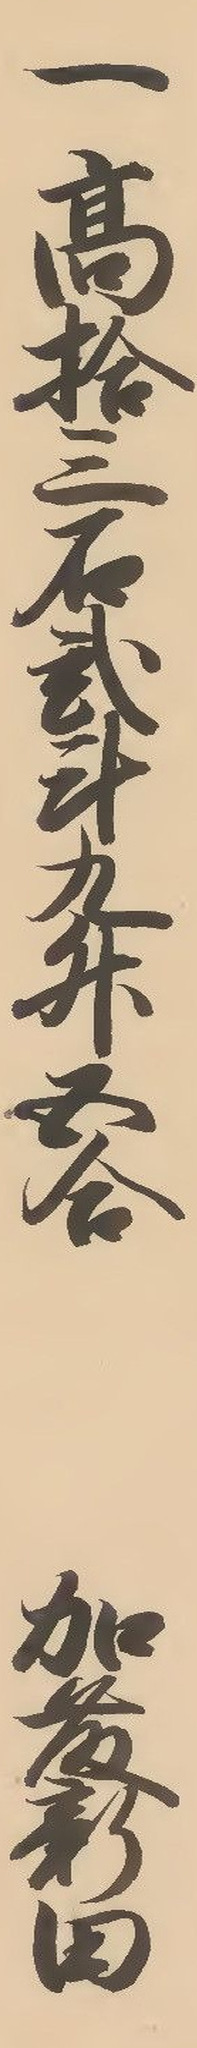一高拾三石弐斗九升五合加藤新田

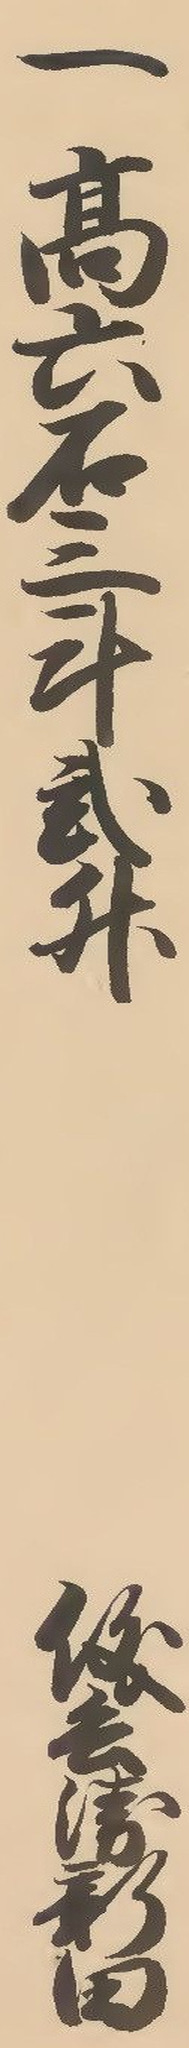一高六石三斗弐升儀兵衛新田
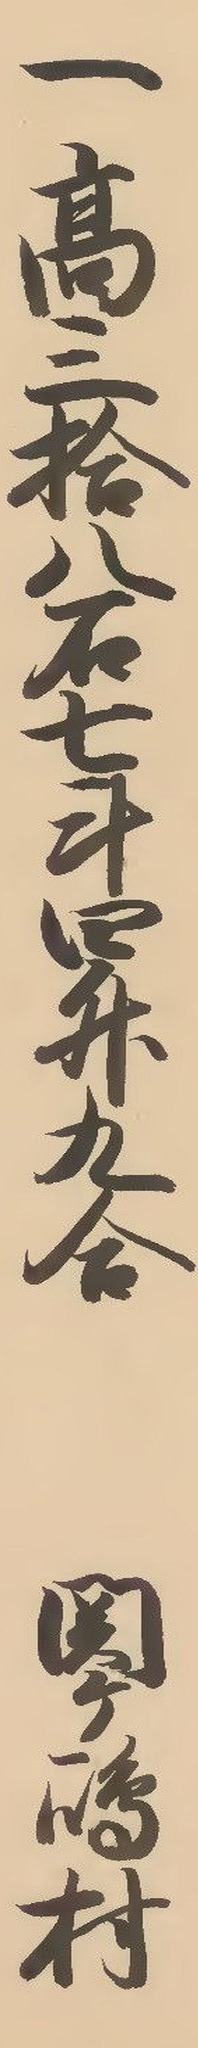一高三拾八石七斗四升九合関ヶ島村
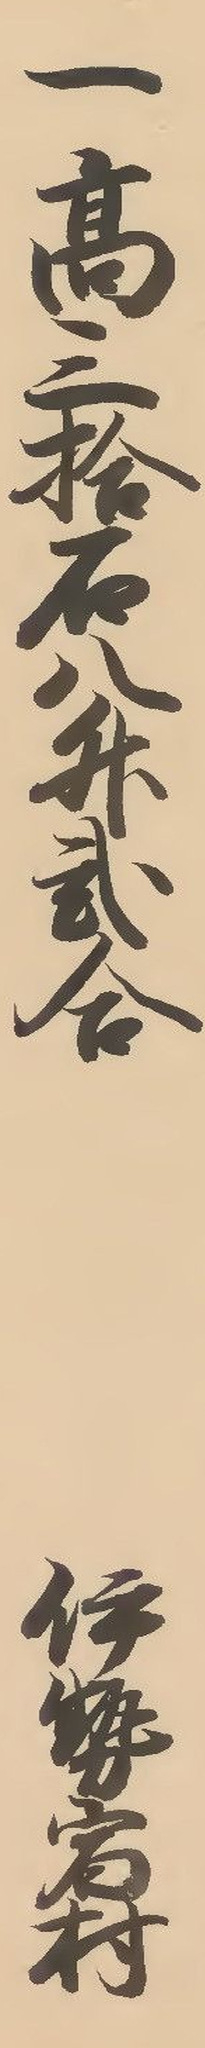一高三拾石八升弐合伊勢宿村
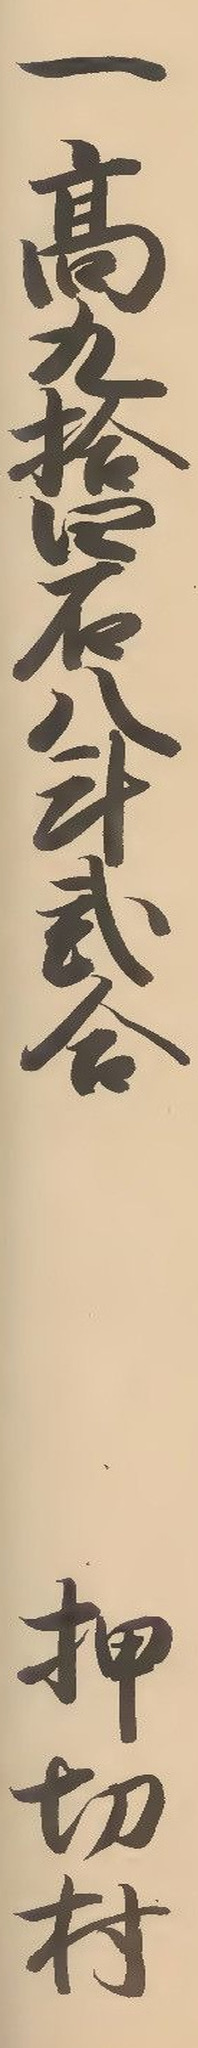一高九拾四石八斗弐合押切村
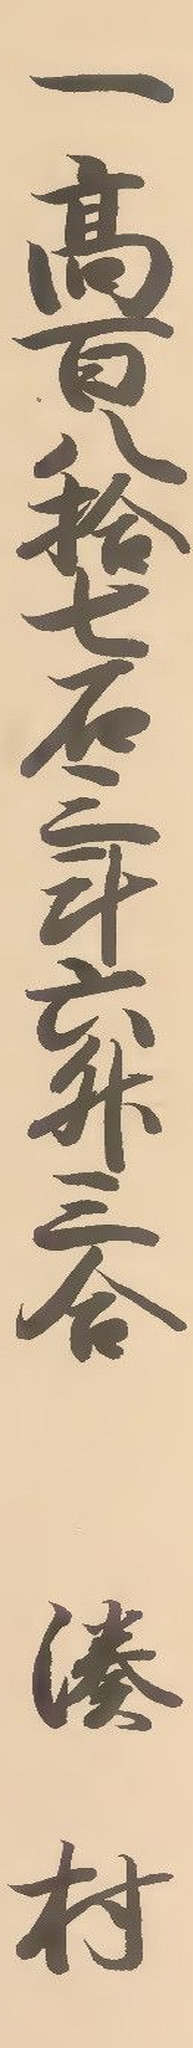一高百八拾七石三斗六升三合湊村
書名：下総国郷帳
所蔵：国立公文書館 National Archives of Japan
